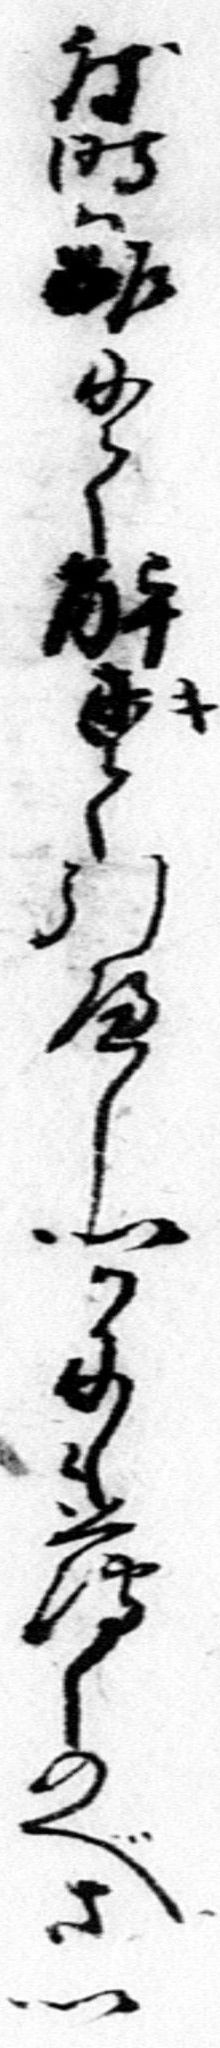度時は酢にて解きて引へしいかにも薄くのべさい
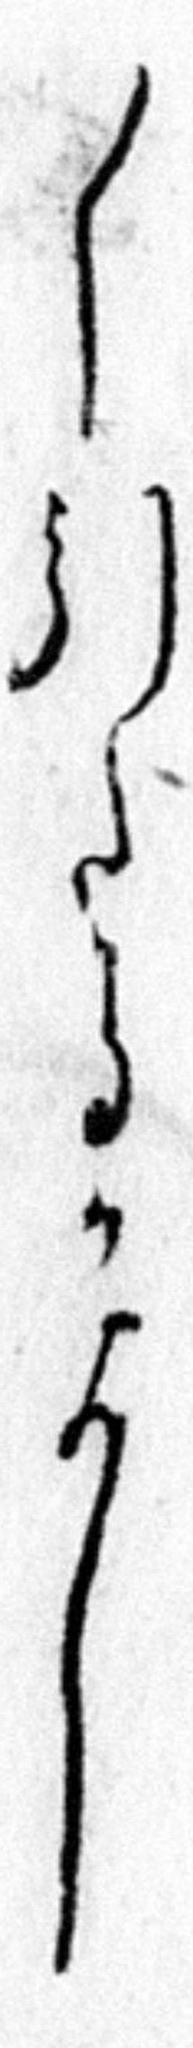〳〵引たるかよし
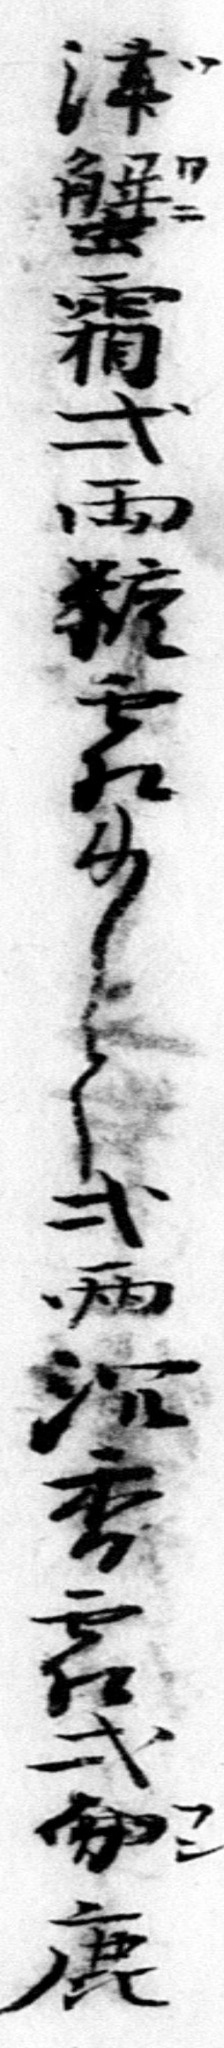津蟹霜弌両糠霜にして弌両沈香霜弌分鹿
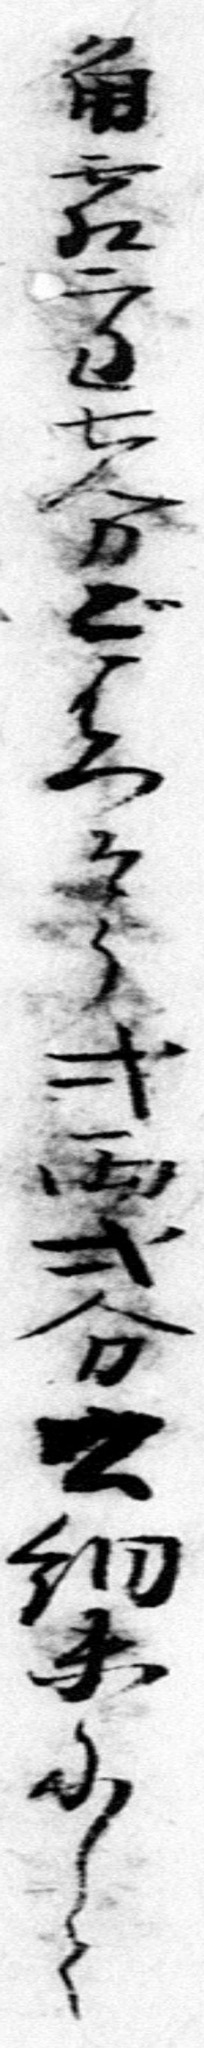角霜二匁七分ごはつそう弌両弌分右細末にして

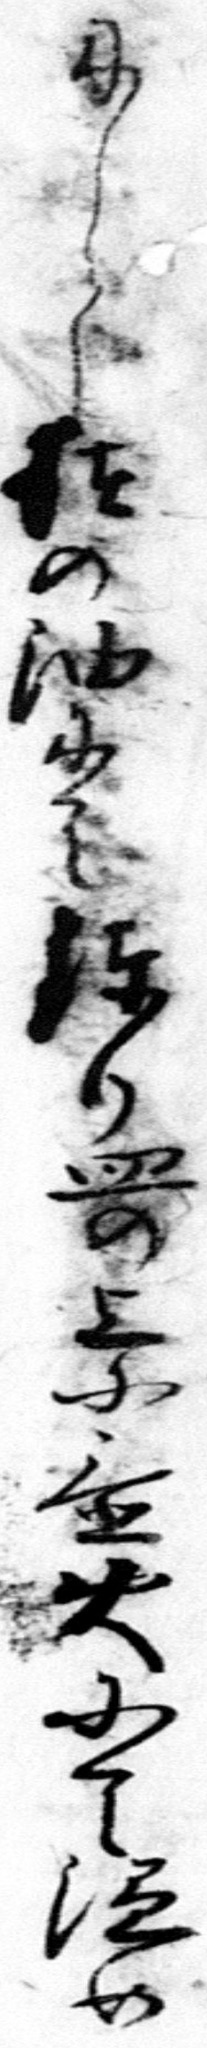にして猪の油にて錬り皿の上に置火にて温め
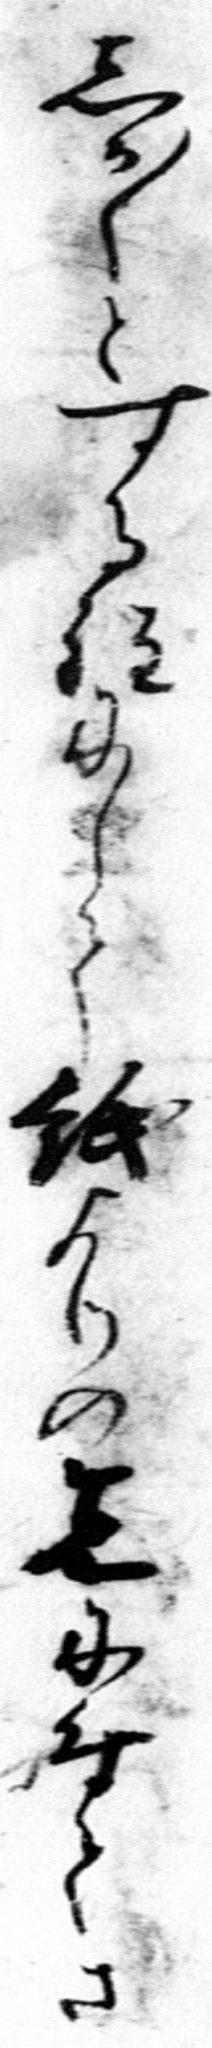しか〳〵とする程にして紙よりの先に付てさ
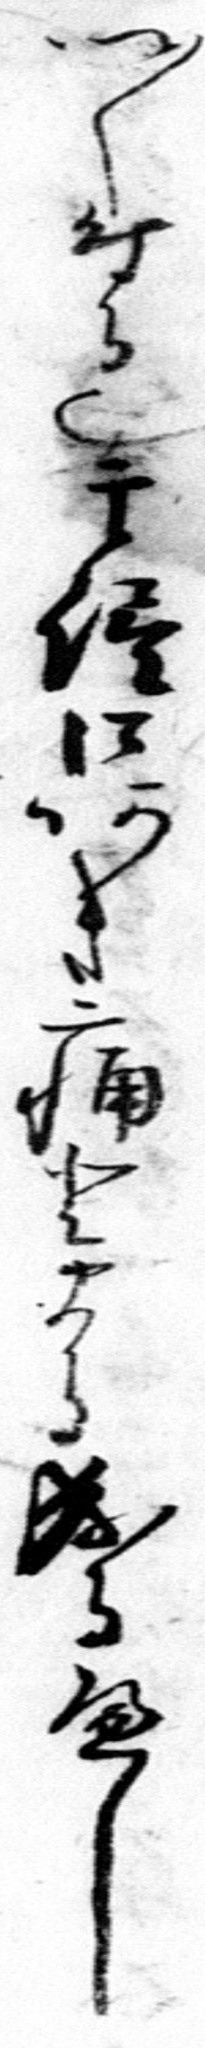い〳〵付る也其儘口あき痛とまる成るへし
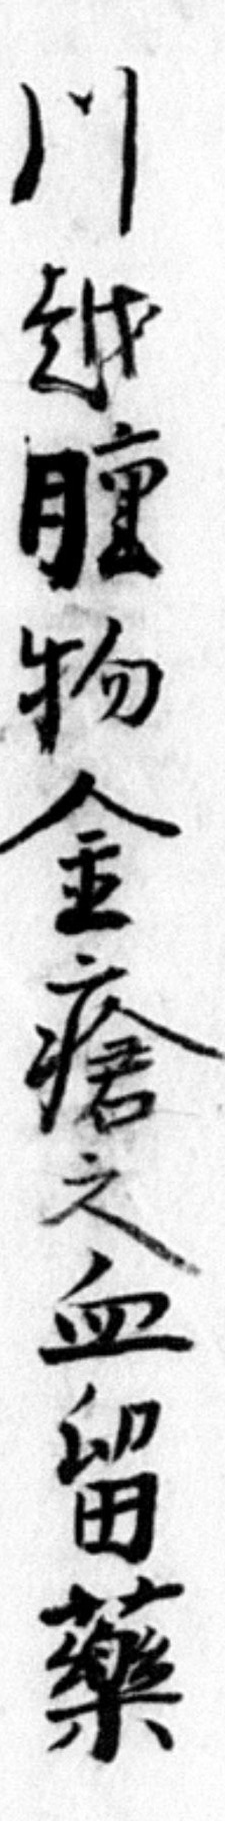川越腫物金瘡之血留薬
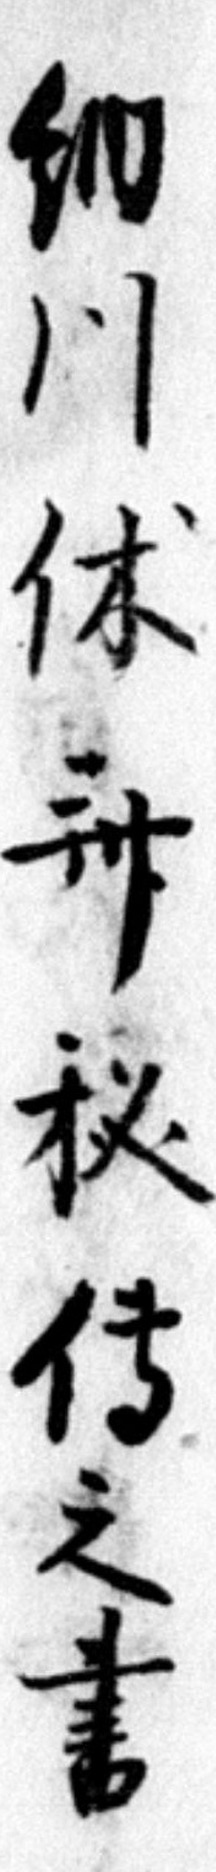細川休斎秘伝之書
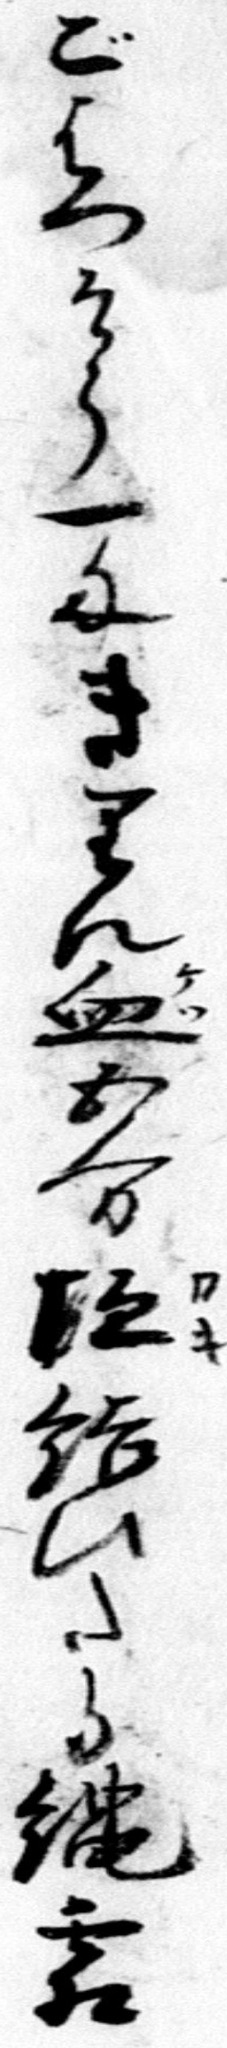ごはつそう一匁きりん血五分垣結ひたる縄霜
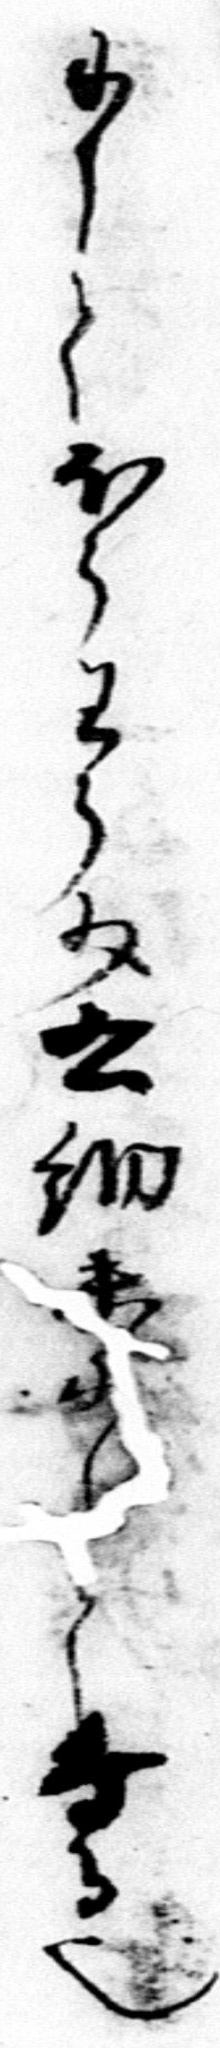にしてほうわう少右細末にして付る也
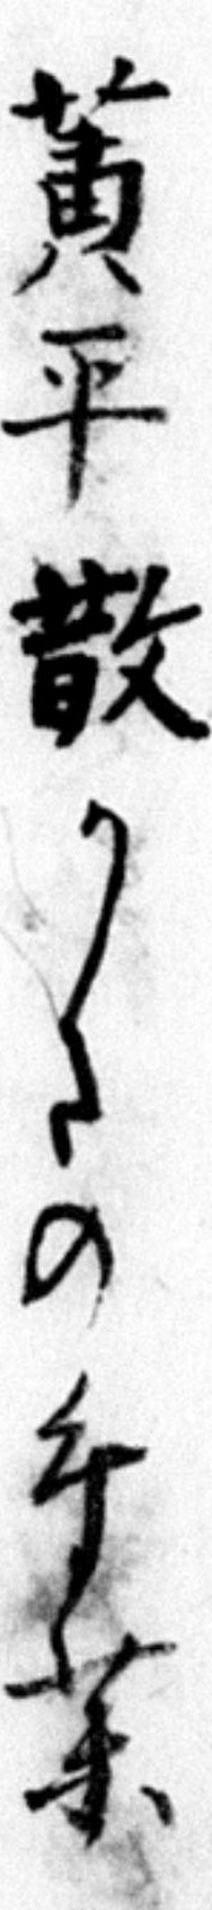黄平散かたの付薬
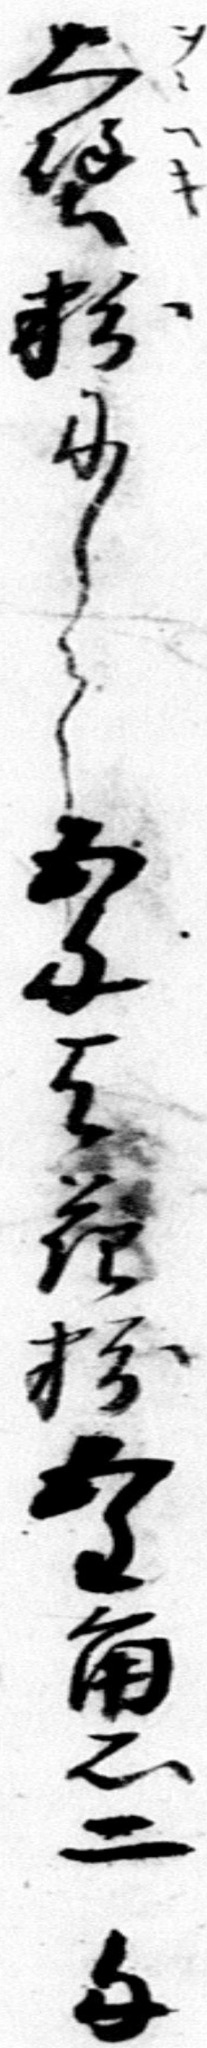大壁粉にして五匁天花粉五匁角石二匁
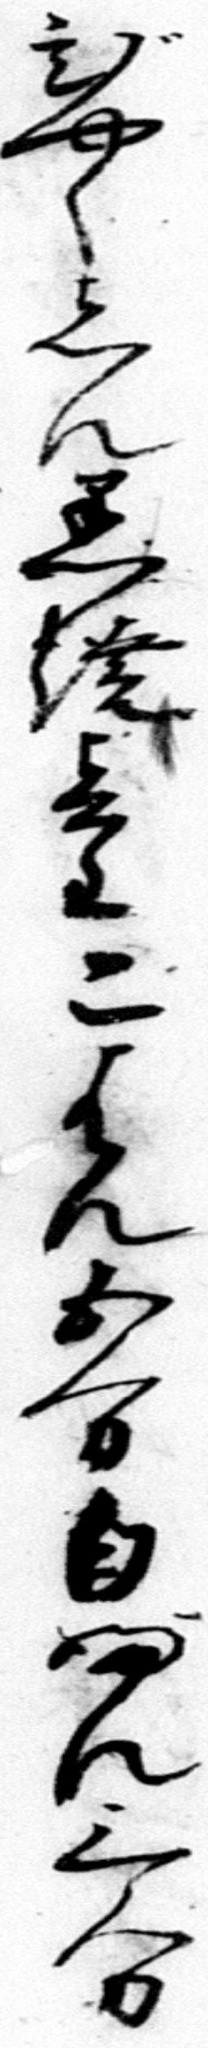びやくしん黒焼壱匁こはん五分白ぶん三分
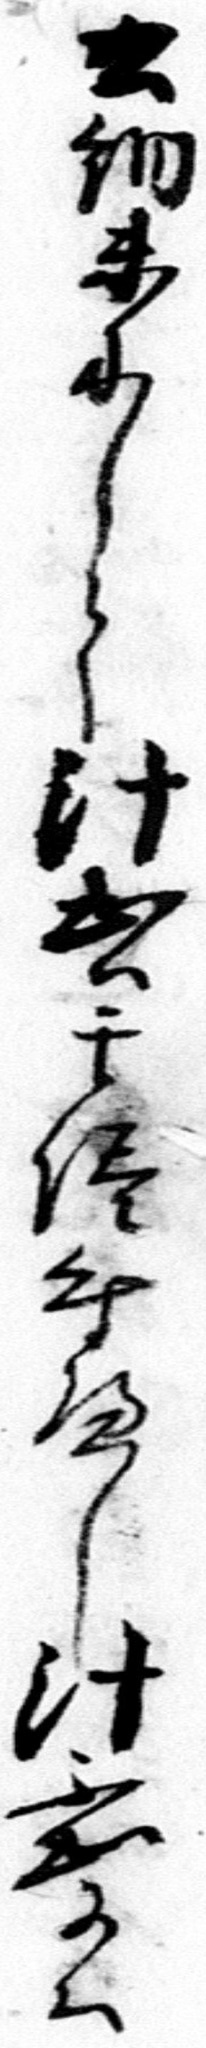右細末にして汁出は其儘付へし汁不出には
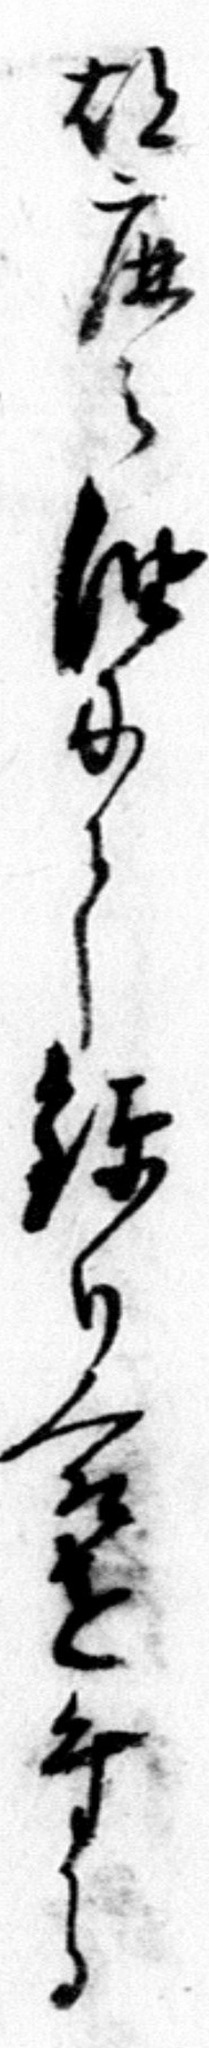胡麻の油にて錬り合せ付る
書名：名薬秘伝之書
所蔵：徳島県立図書館
